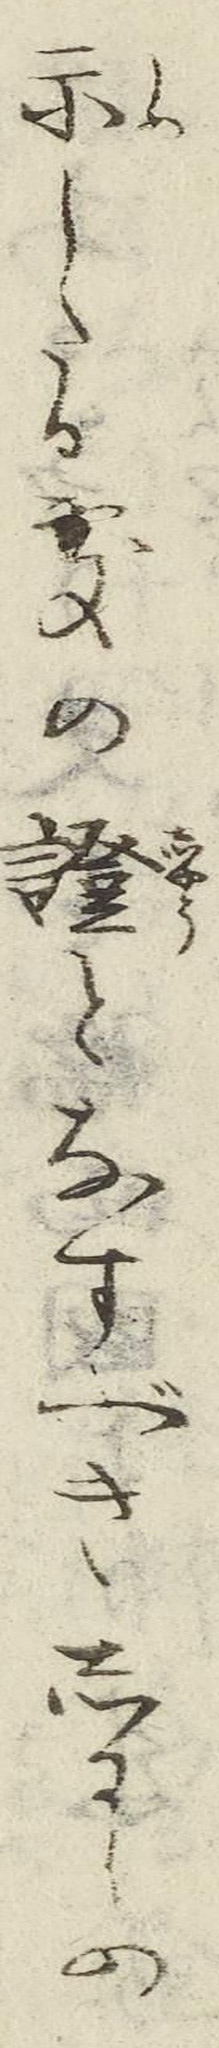示したる処の証となすべきしるしの
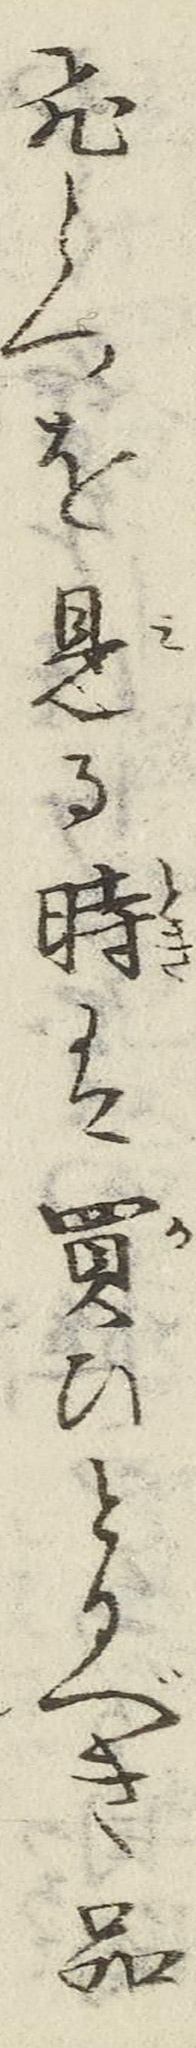ひとつを見る時は買ひとるべき品
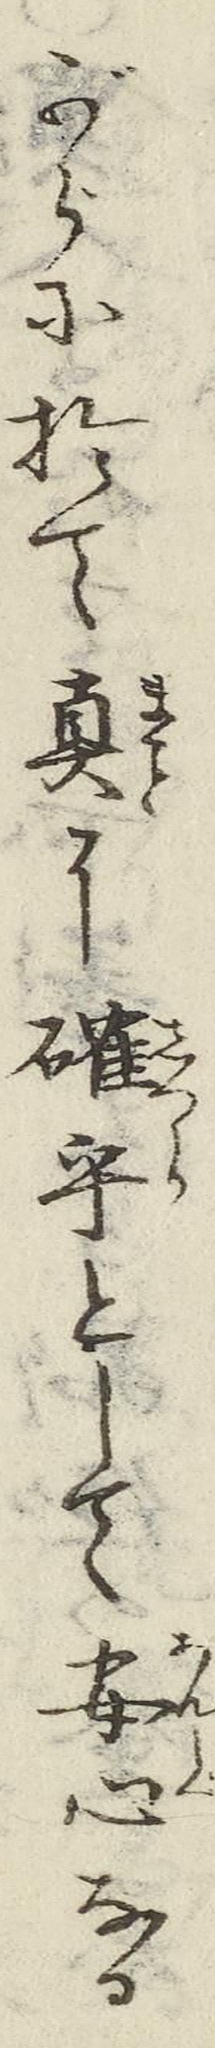がらに於て真に確乎として安心なる
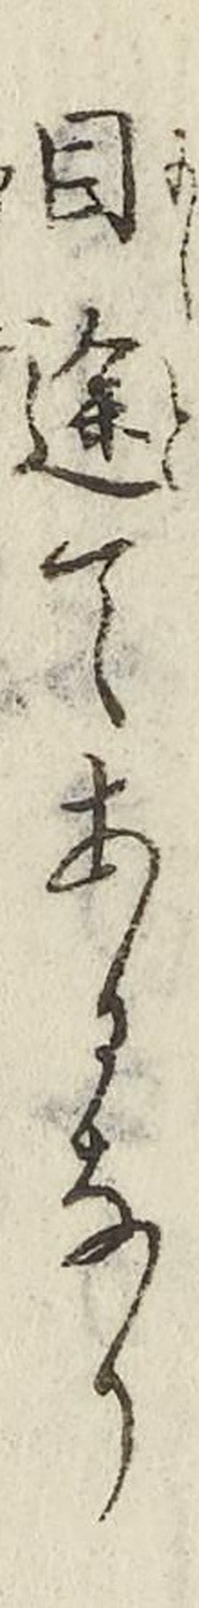目途てあるなり
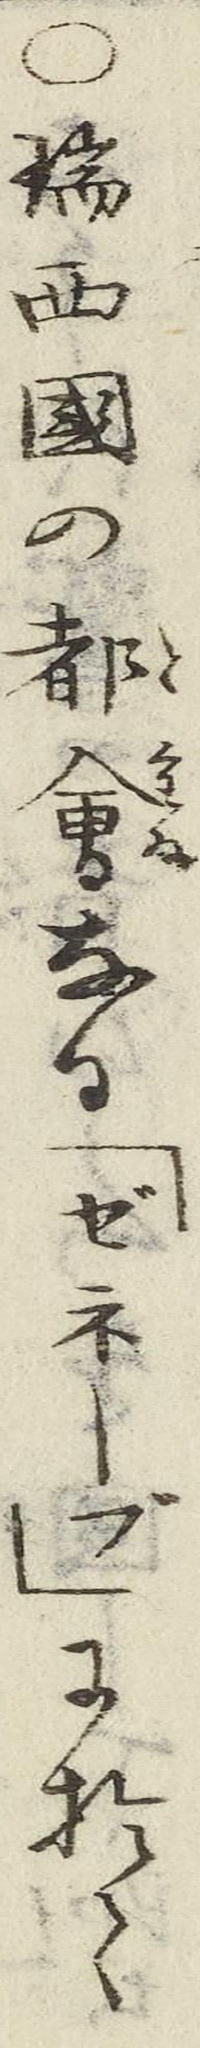○瑞西国の都会なる「ゼネーブ」に於て
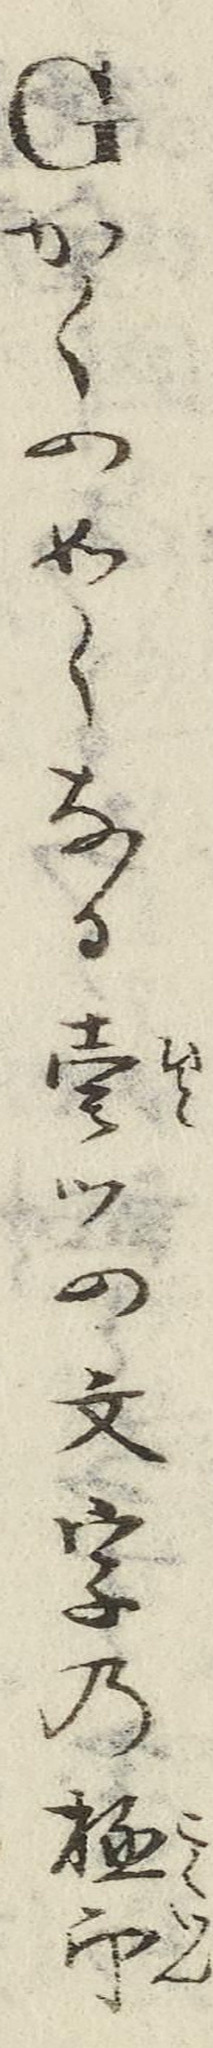Ｇかくの如くなる壹つの文字の極印
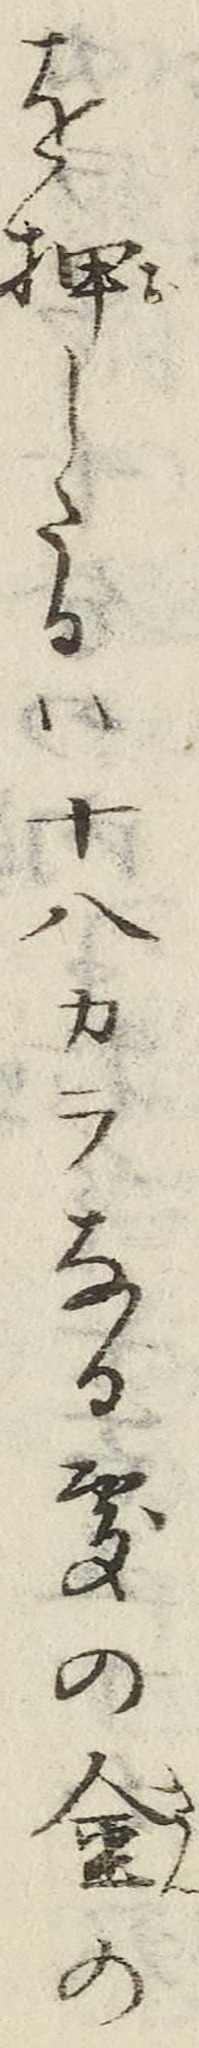を押したるは十八カラなる処の金の
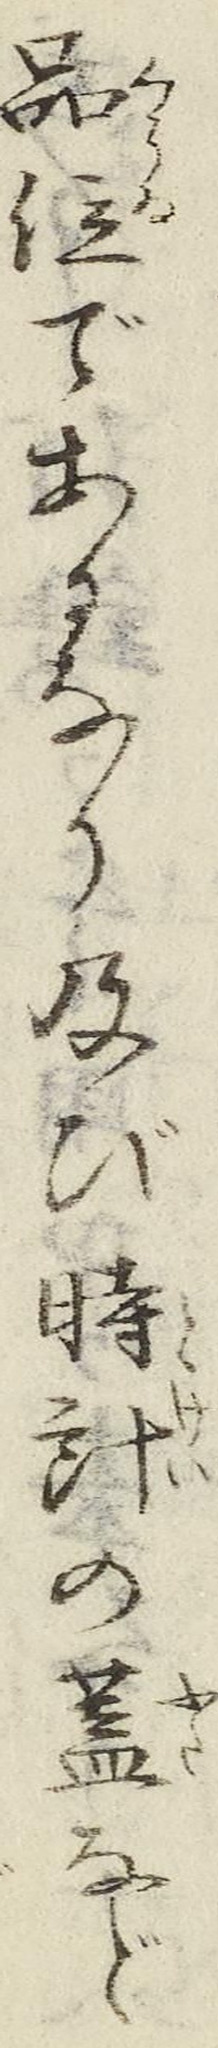品位であるなり及び時計の蓋など
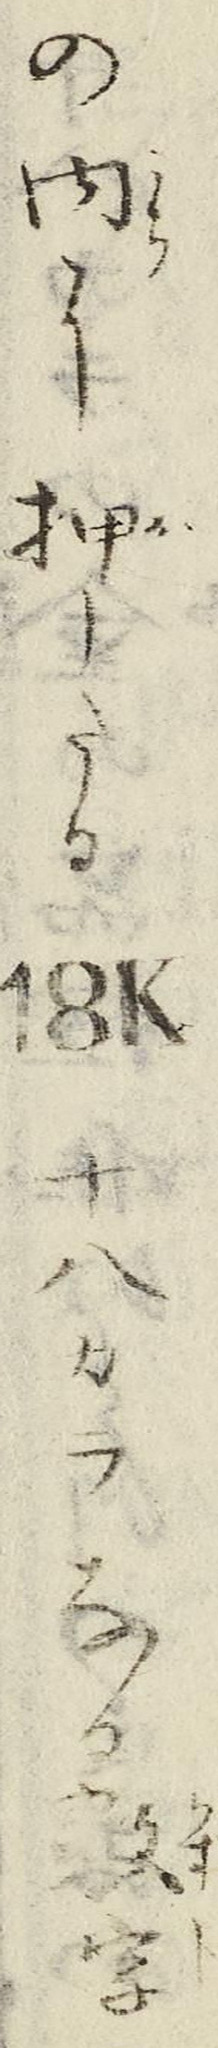の内に押したる１８Ｋ十八カラなる数字
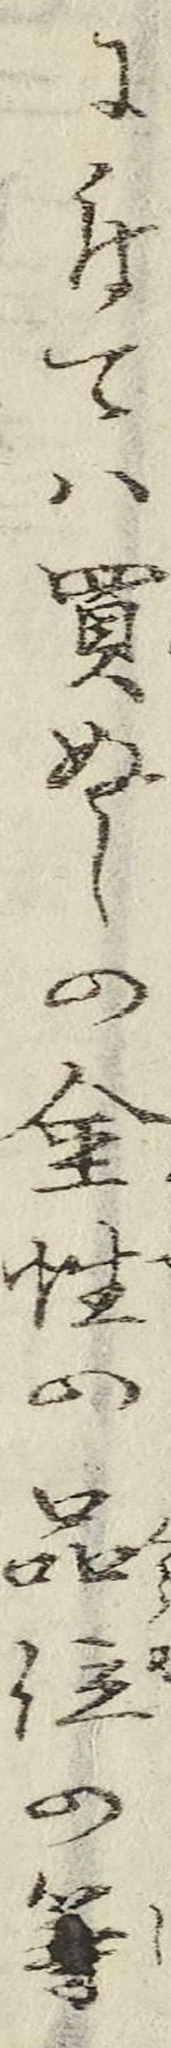に付ては買ぬしの金性の品位の等
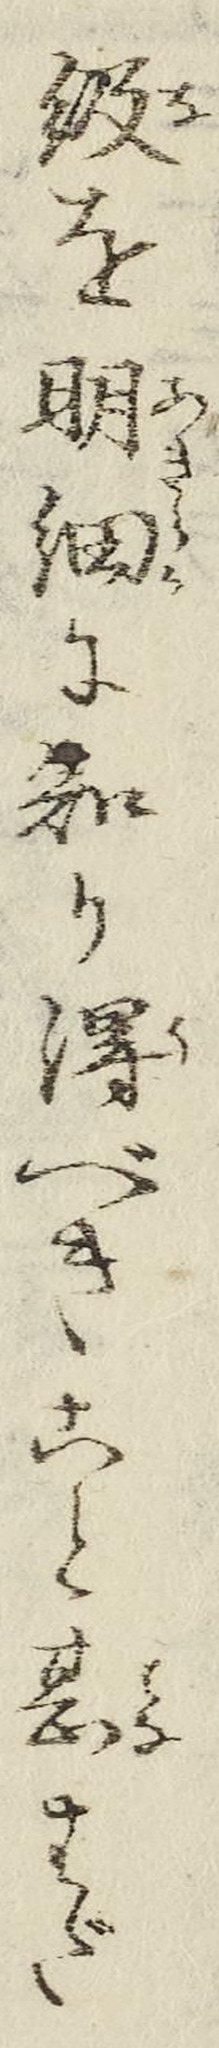級を明細に知り得べきこと甚はだ
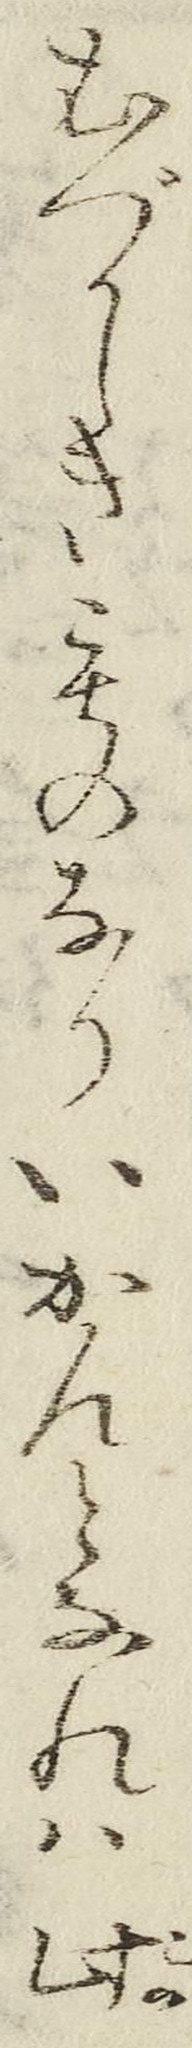むづかしきものなりいかんとなれは此
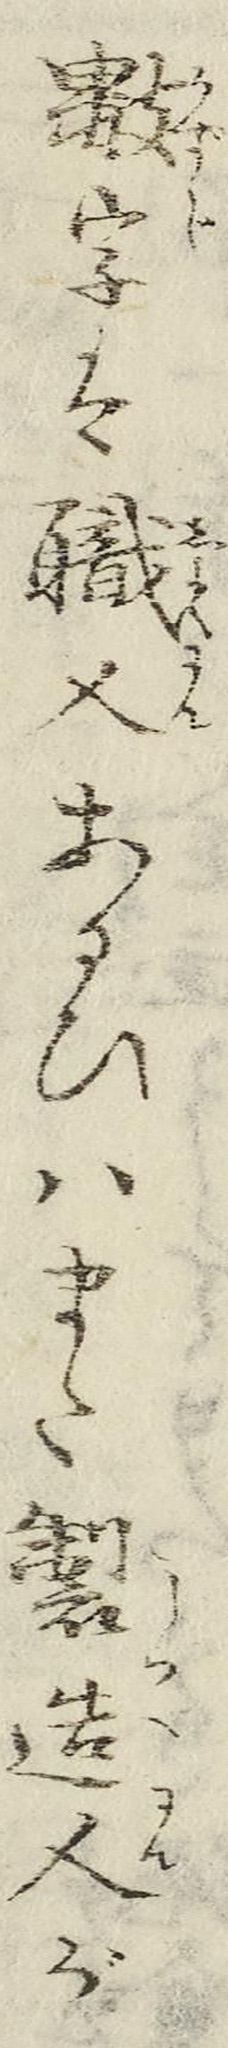数字は職人あるひはまた製造人が
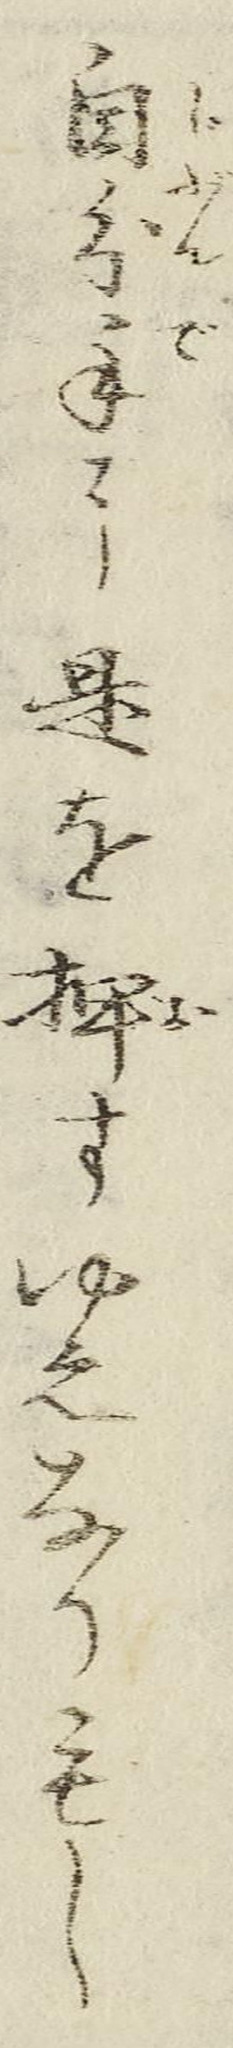自分手に是を押すゆえなりもし
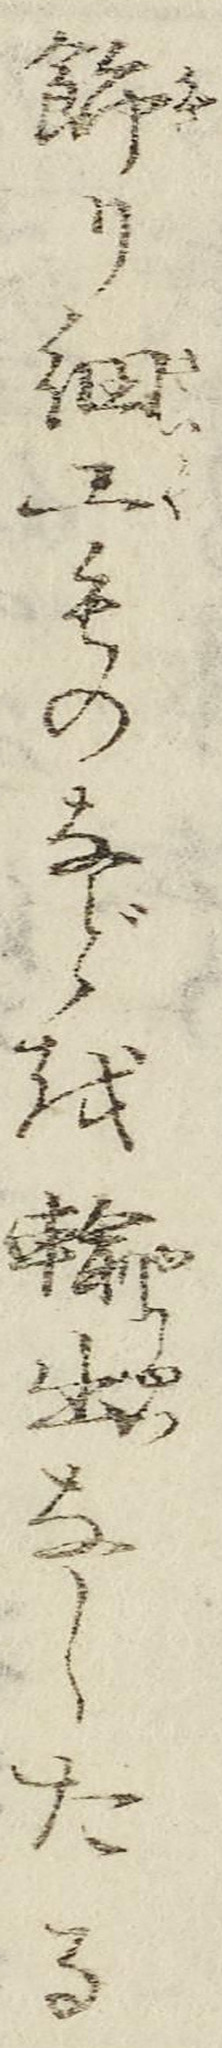飾り細工ものなどを輸出なしたる
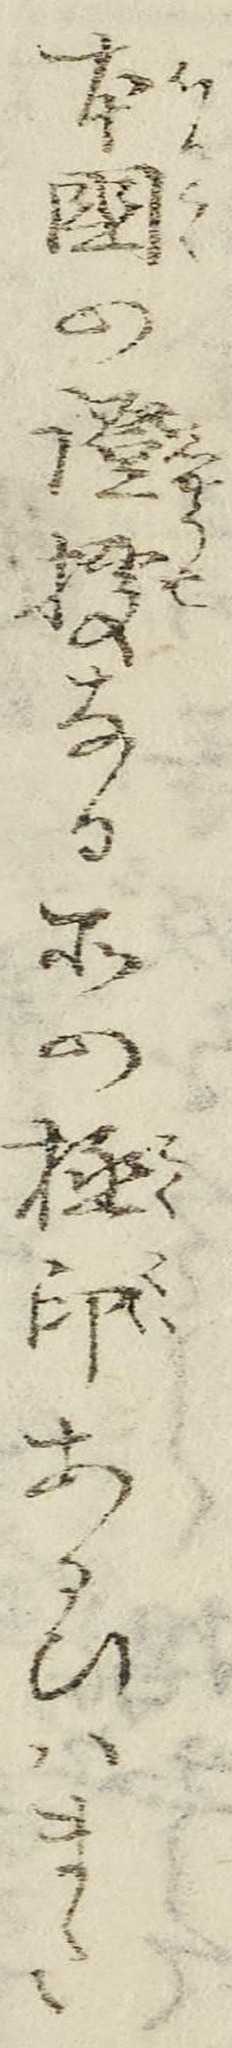本国の証拠なる所の極印あるひはまた
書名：[時計に関する冊子]
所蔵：東京大学地震研究所図書室 Earthquake Research Institute Library, The University of Tokyo, JAPAN
